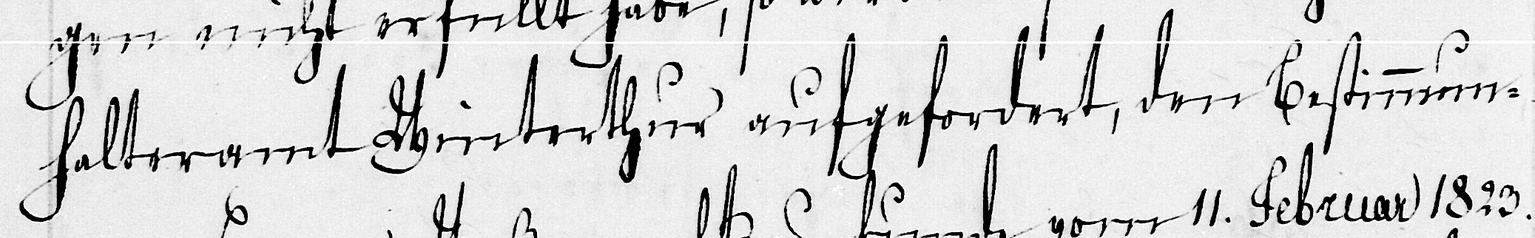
thalteramt Winterthur aufgefordert, den Bestimmun¬
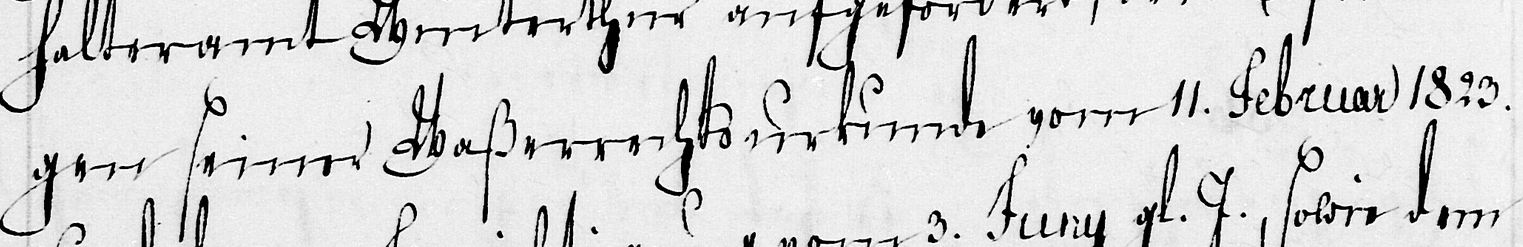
gen seiner Waßerrechtsurkunde vom 11. Februar 1823.
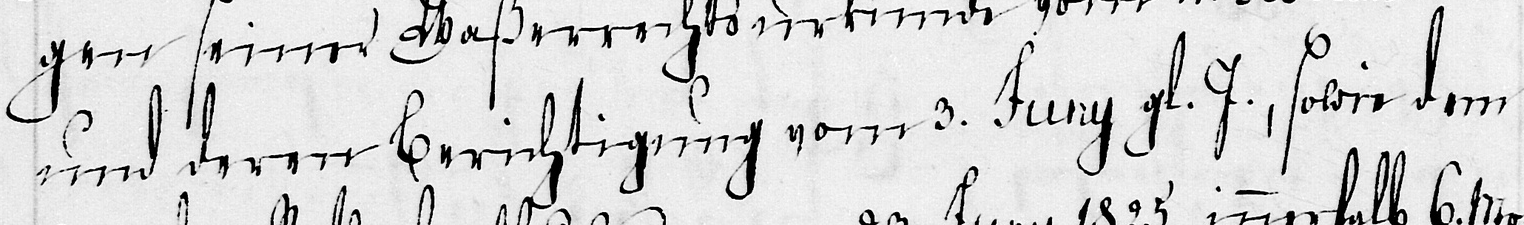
und deren Berichtigung vom 3. Juny gl. J., sowie dem
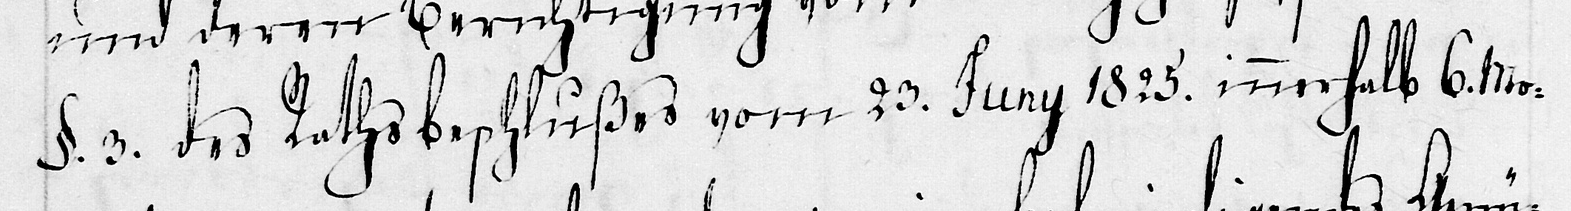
§. 3. des Rathsbeschlußes vom 23. Juny 1825. innerhalb 6. Mo¬
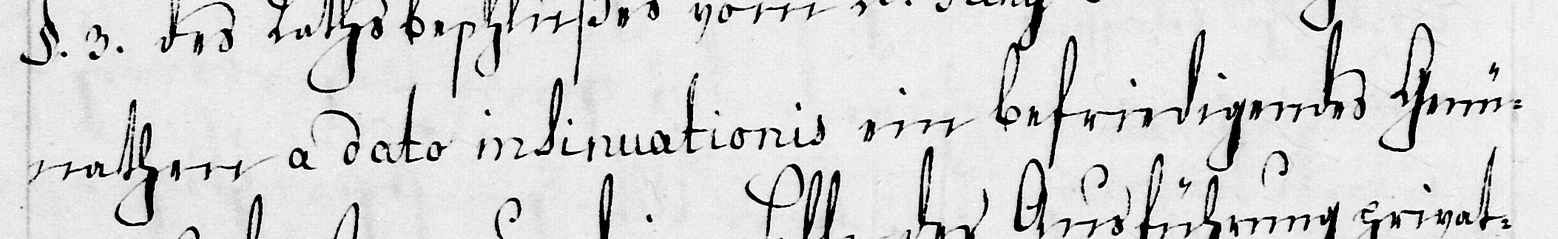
nathen a dato insinuationis ein befriedigendes Genü¬
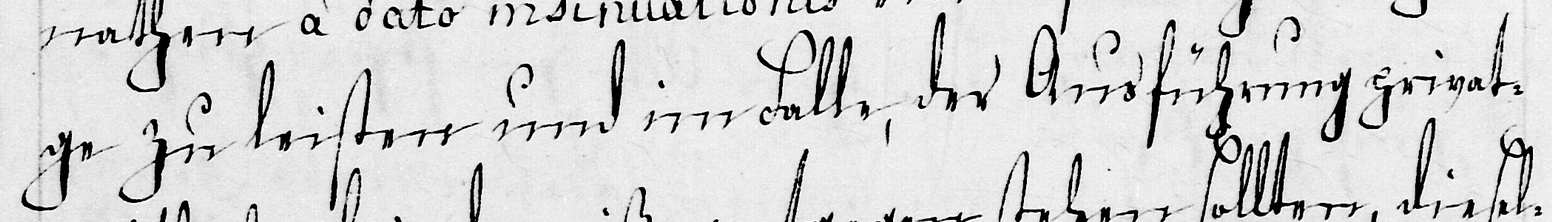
ge zu leisten und im Falle, der Ausführung privat¬
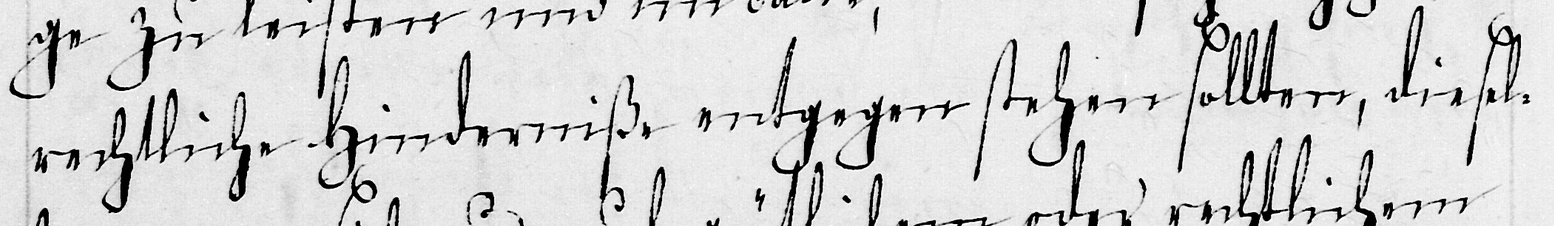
rechtliche Hinderniße entgegen stehen sollten, diese¬
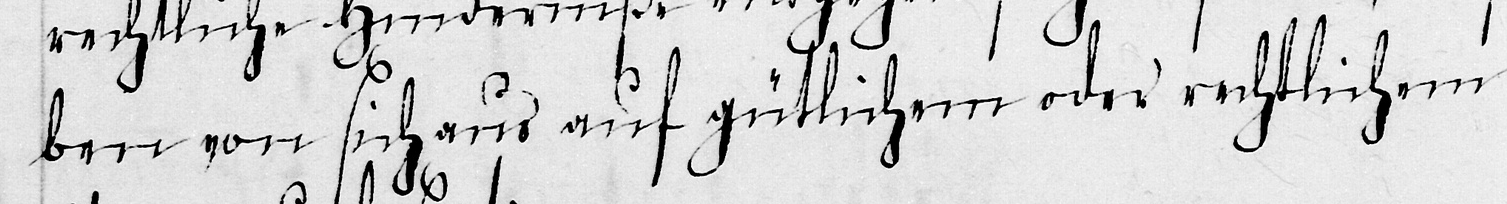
lben von sich aus auf gütlichem oder rechtlichem
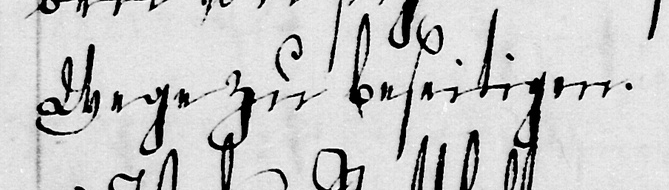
Wege zu beseitigen.
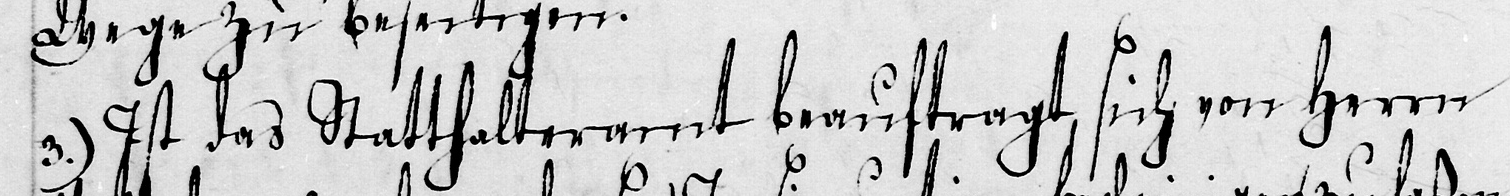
3.) Ist das Statthalteramt beauftragt, sich von Herrn
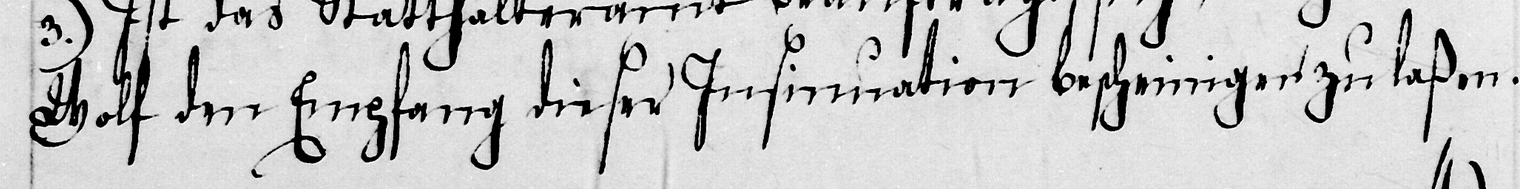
Wolf den Empfang dieser Insinuation bescheinigen zu laßen.
